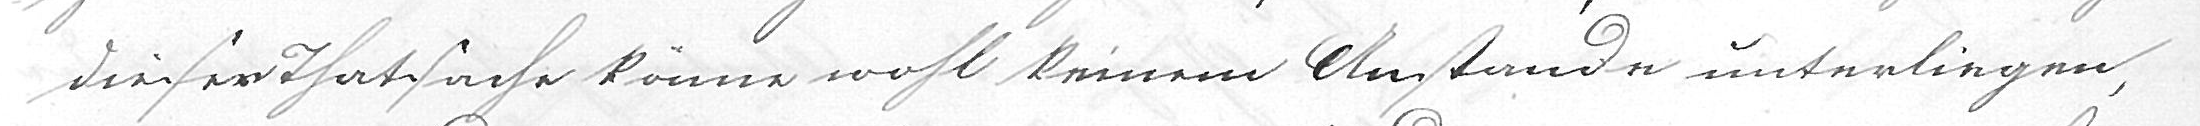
dieser Thatsache könne wohl keinem Anstande unterliegen,
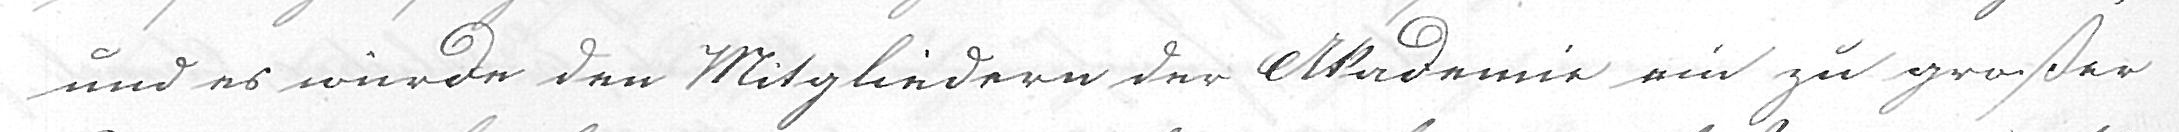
und es würde den Mitgliedern der Akademie ein zu großer
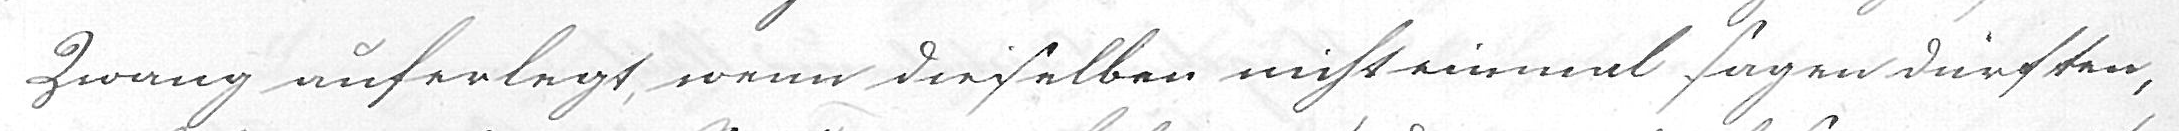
Zwang auferlegt, wenn dieselben nicht einmal sagen dürften,
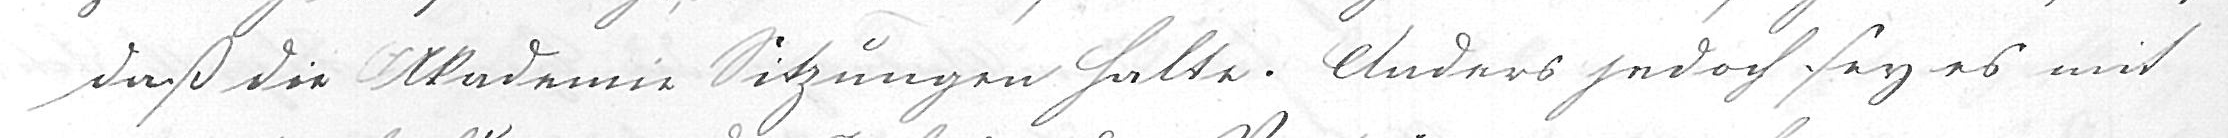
daß die Akademie Sitzungen halte. Anders jedoch sey es mit
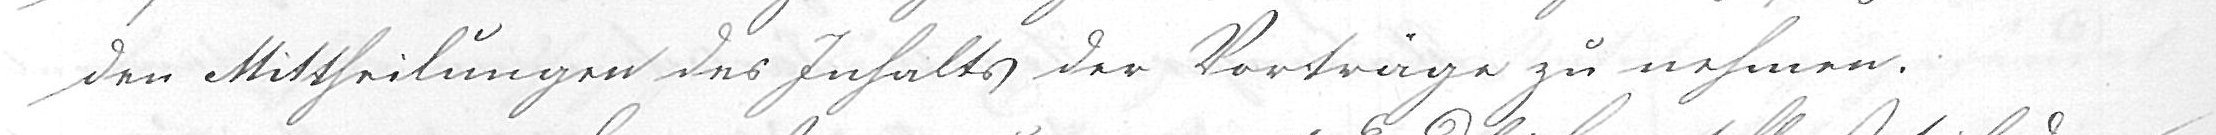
den Mittheilungen des Inhalts der Vorträge zu nehmen.
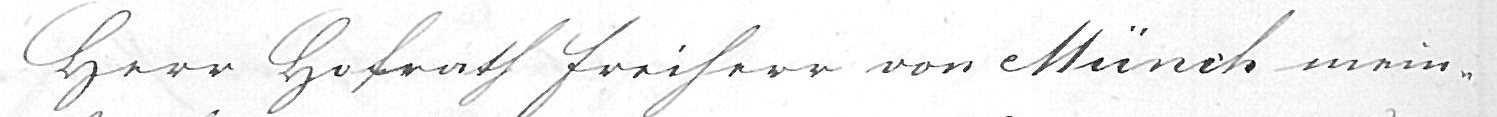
Herr Hofrath Freiherr von Münch mein
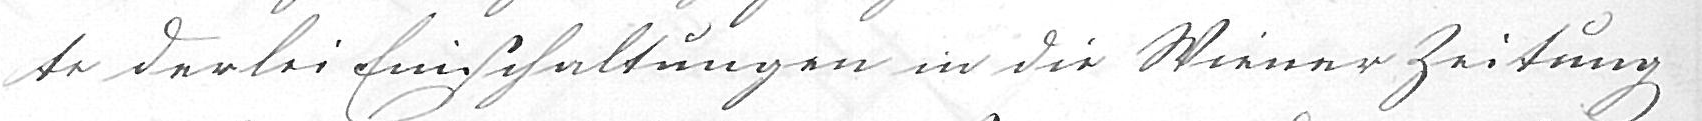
te derlei Einschaltungen in die Wiener Zeitung
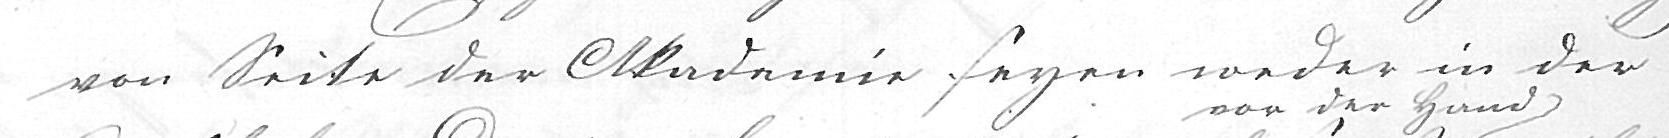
von Seite der Akademie seyen weder in der
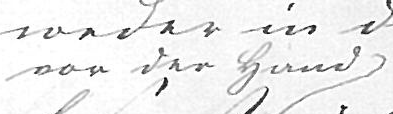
vor der Hand
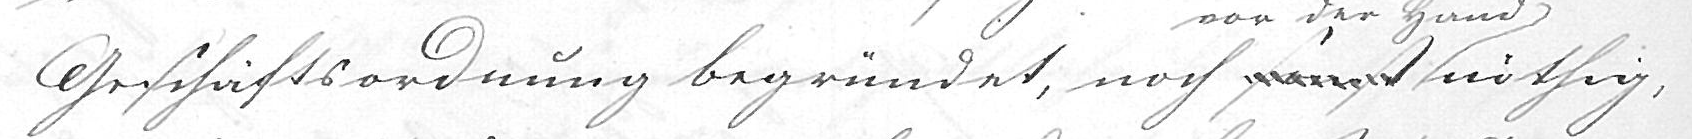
Geschäftordnung begründet, noch nöthig;
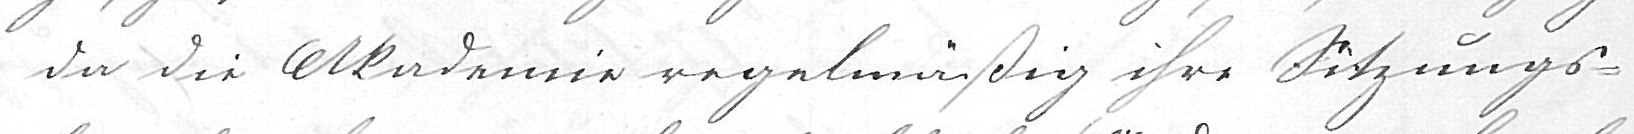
da die Akademie regelmäßig ihre Sitzungs-
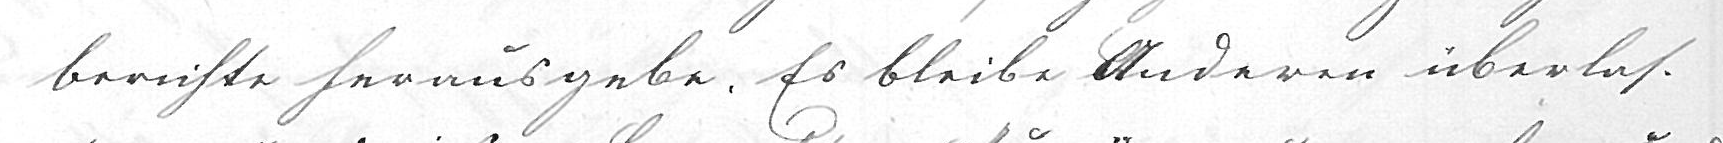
berichte herausgebe. Es bleibe Anderen überlas-
